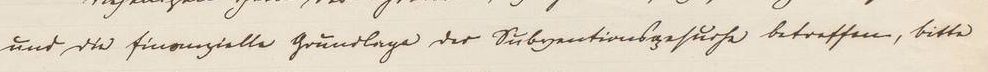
und die finanzielle Grundlage der Subventionsgesuche betreffen, bitte
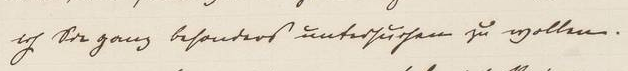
ich Sie ganz besonders untersuchen zu wollen.
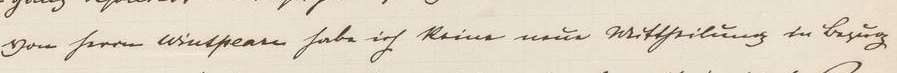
Von Herrn Winspeare habe ich keine neue Mittheilung in Bezug
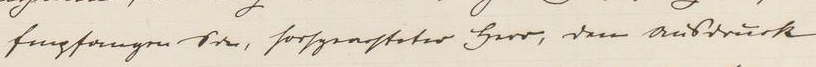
Empfangen Sie, hochgeachteter Herr, den Ausdruck
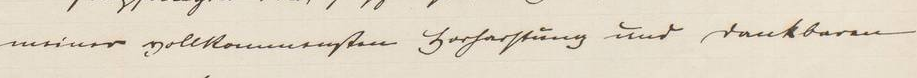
meiner vollkommensten Hochachtung und dankbaren
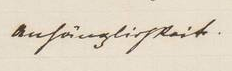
Anhänglichkeit.
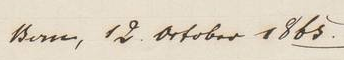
Bern, 12. Oktober, 1865.
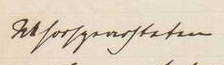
M hochgeachteten
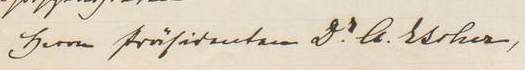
Herrn Präsidenten Dr A. Escher,
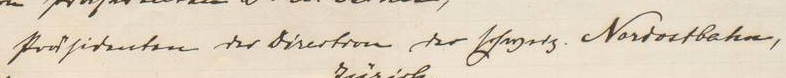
Präsidenten der Direction der schweiz. Nordostbahn,
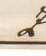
fr.
